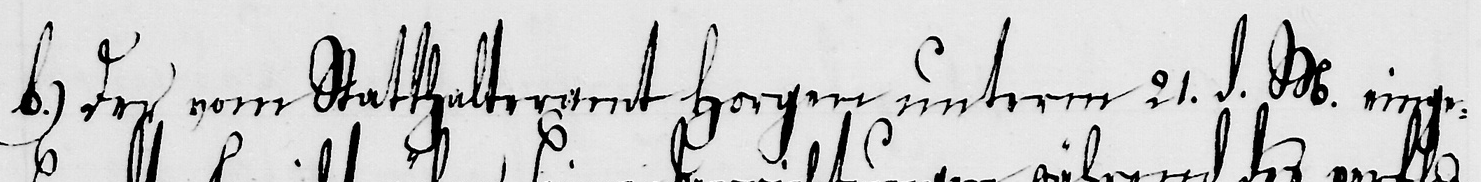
b.) Der vom Statthalteramt Horgen unterm 21. d. M. einge¬
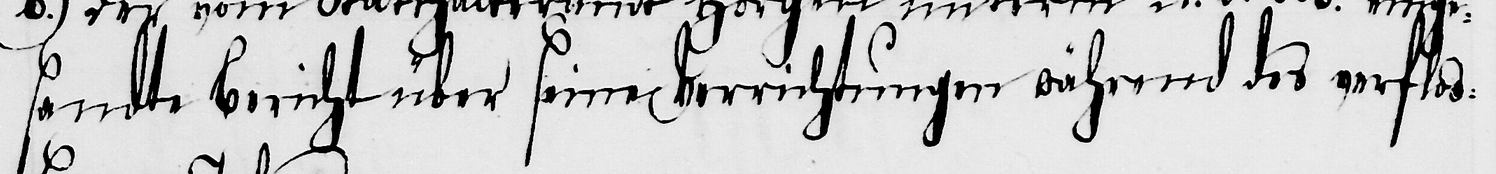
sandte Bericht über seine Verrichtungen während des verflo¬
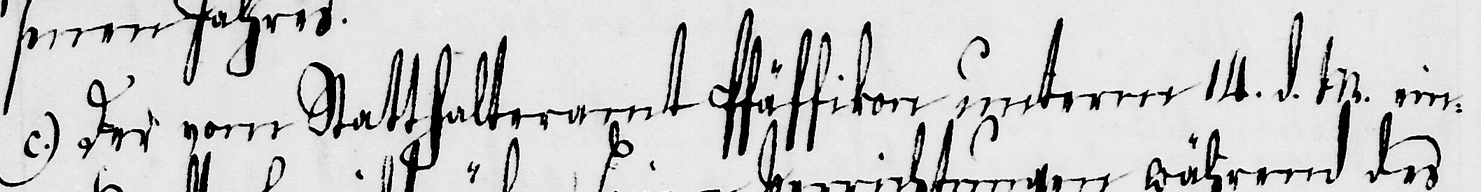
c.) Der vom Statthalteramt Pfäffikon unterm 14. d. M. ei¬
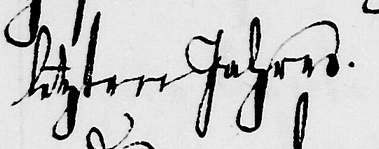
letzten Jahres.
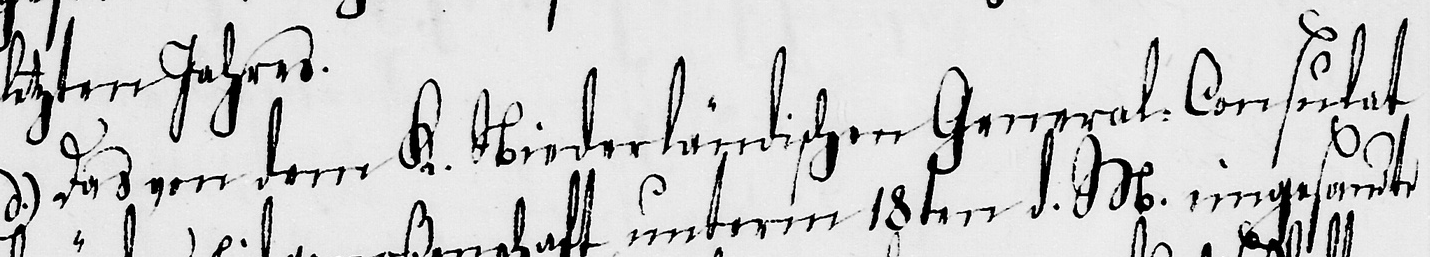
Das von dem K. Niederländischen General-Consulat
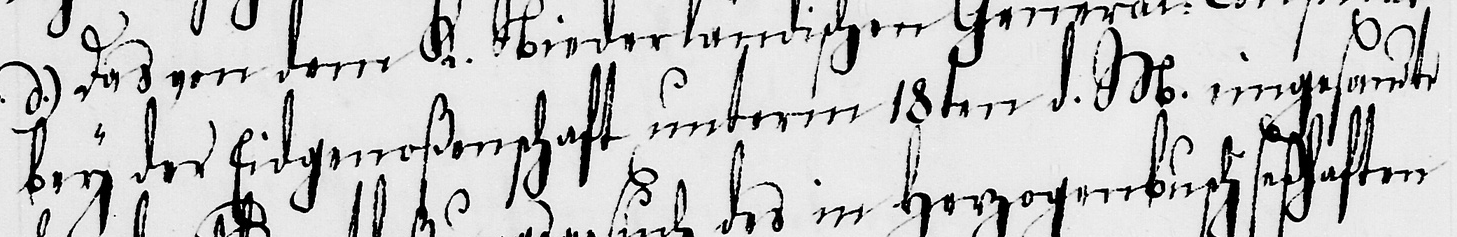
bey der Eidgenoßenschaft unterm 18ten d. M. eingesandte
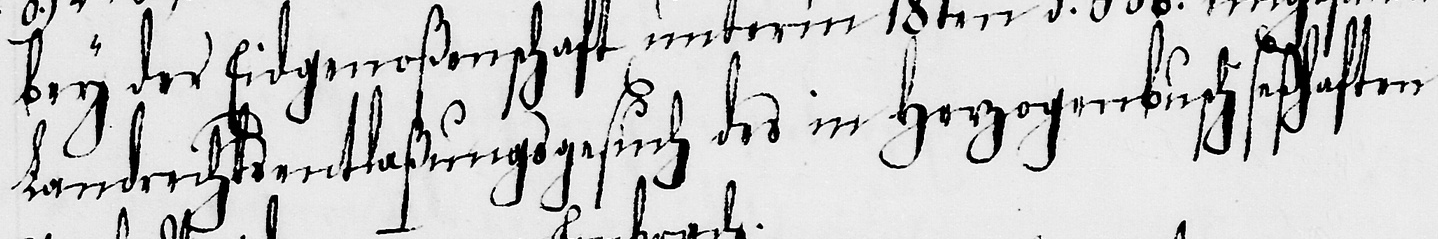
andrechtsentlaßungsgesuch des in Herzogenbuch seßhaft¬
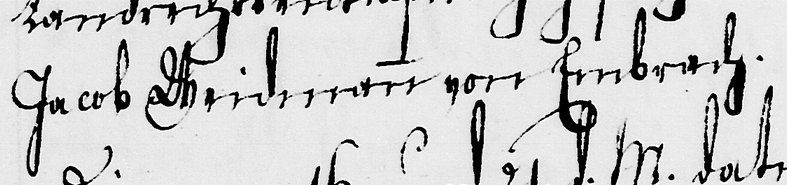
Jacob Weidmann von Embrach.
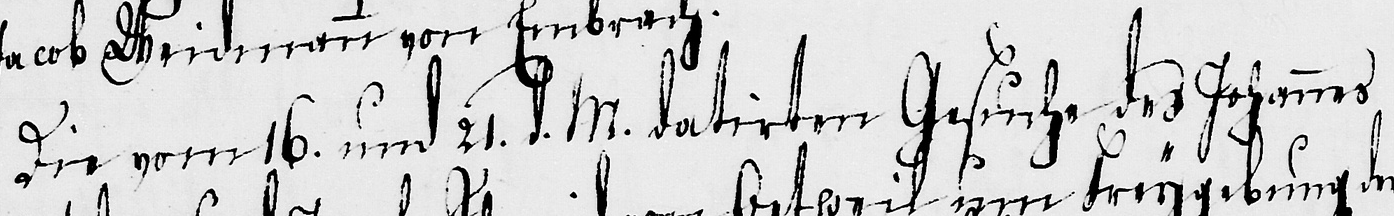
Die vom 16. und 21. d. M. datirten Gesuche des Johannes
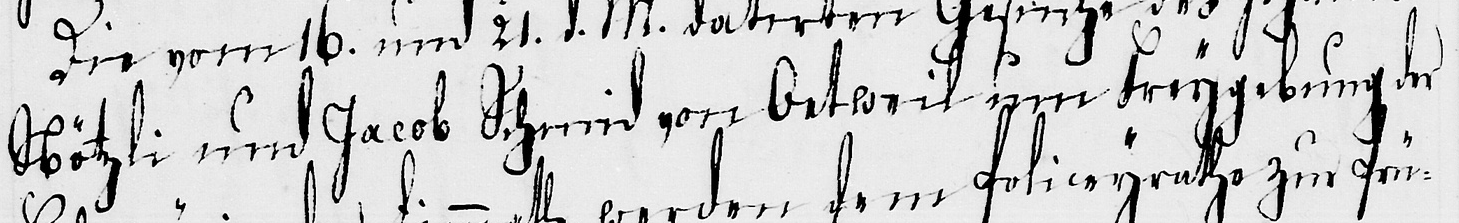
Nötzli und Jacob Schmid von Oetweil um Freygebung der
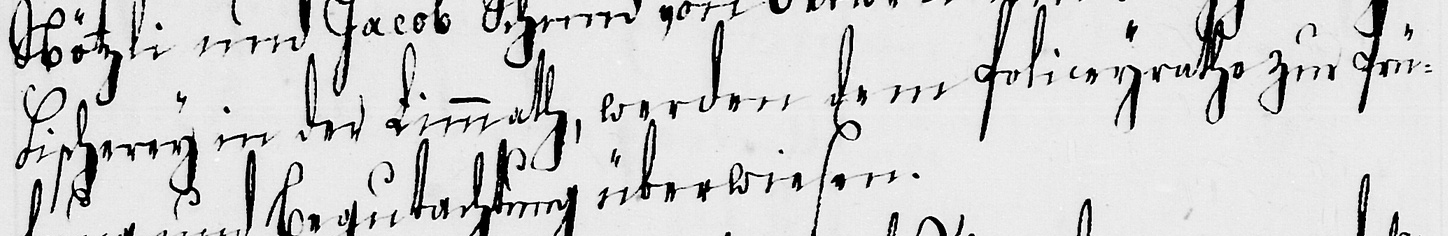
Fischerey in der Limmath, werden dem Policeyrathe zur Prü¬
